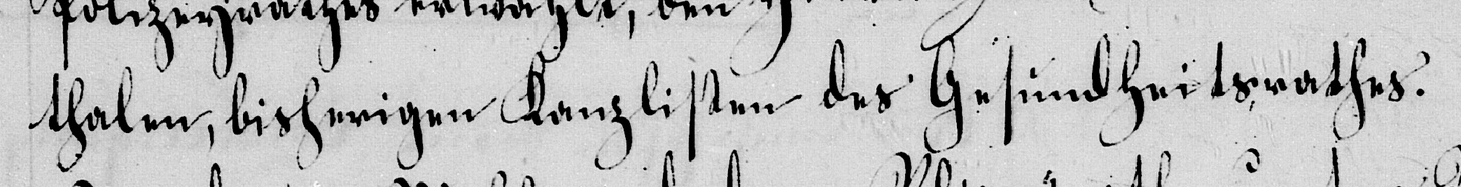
thalen, bisherigen Kanzlisten des Gesundheitsrathes.
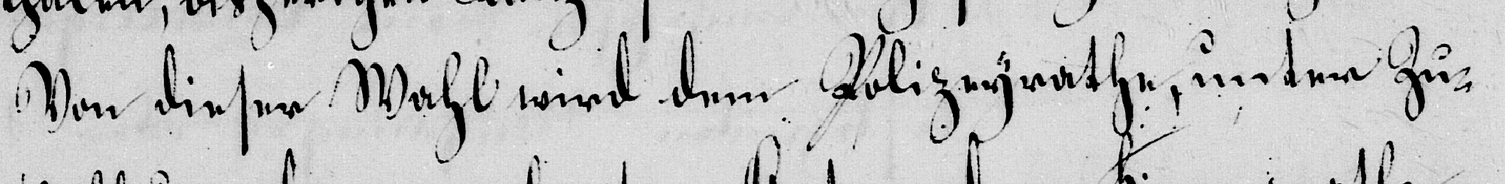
Von dieser Wahl wird dem Polizeyrathe, unter Zu¬
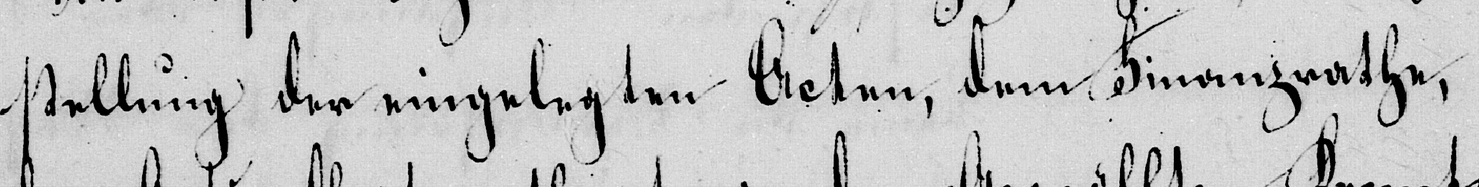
stellung der eingelegten Acten, dem Finanzrathe,
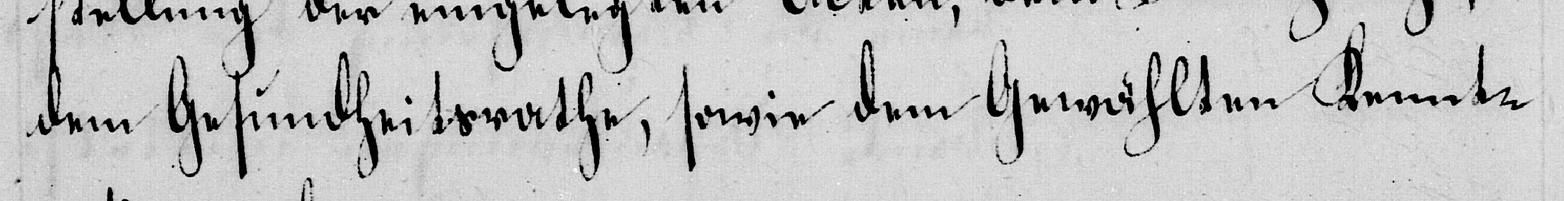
dem Gesundheitsrathe, sowie dem Gewählten Kennt¬
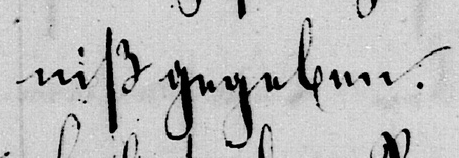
niß gegeben.
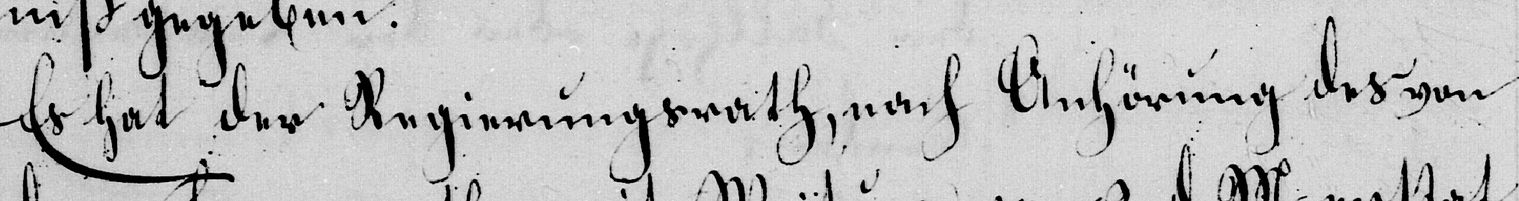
Es hat der Regierungsrath, nach Anhörung des von
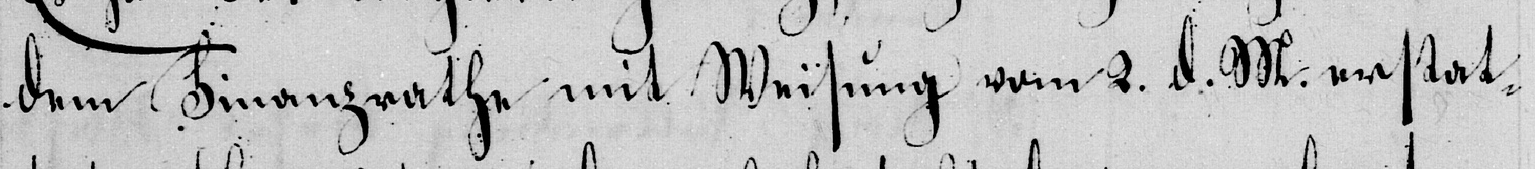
dem Finanzrathe mit Weisung vom 2. d. M. erstat¬
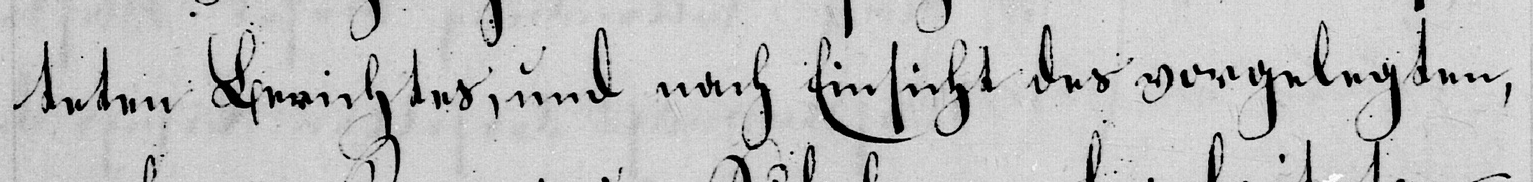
teten Berichtes, und nach Einsicht des vorgelegten,
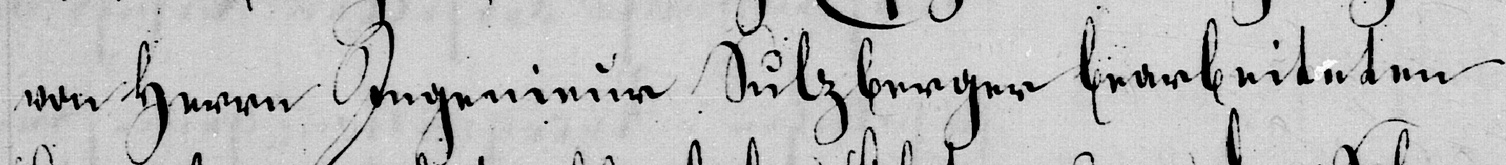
von Herrn Ingenieur Sulzberger bearbeiteten
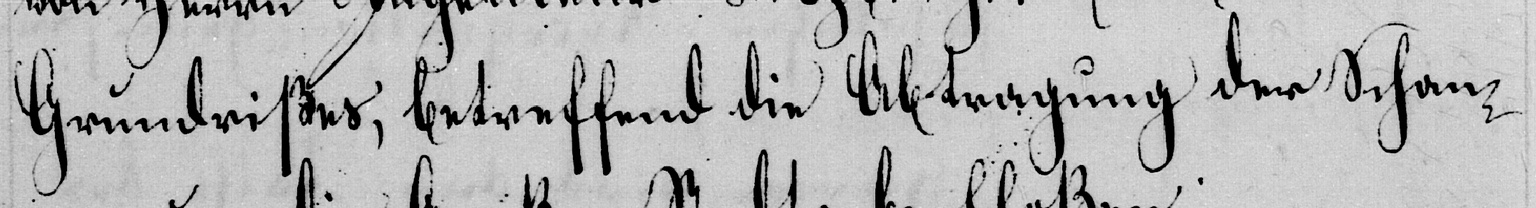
Grundrißes, betreffend die Abtretung der Schan¬
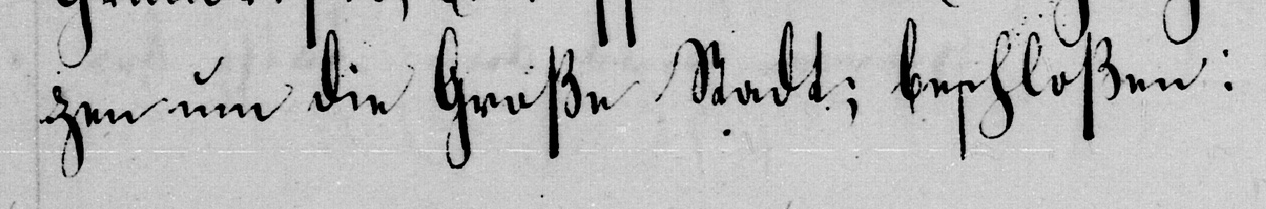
zen um die Große Stadt; beschloßen:
